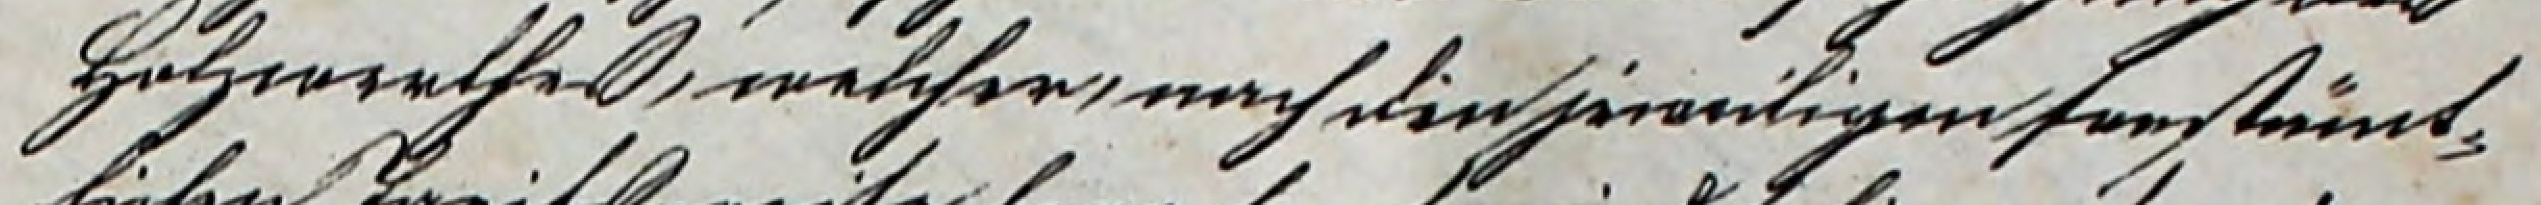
Holzwerthes, welcher, nach die jeweiligen forstämt„
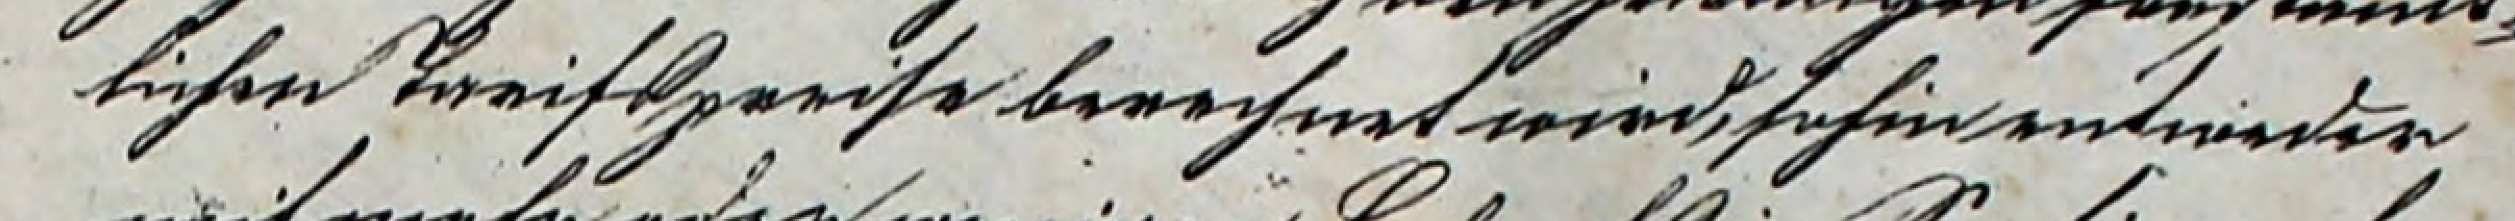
lichen Tarifspreise berechnet wird, sohin entwerder
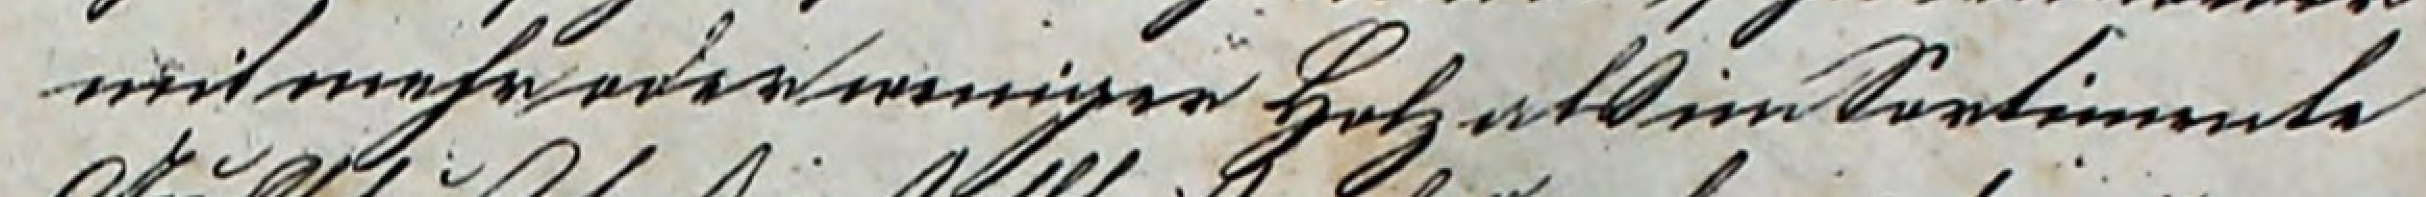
mit mehr oder weniger Holz als im Sortimente
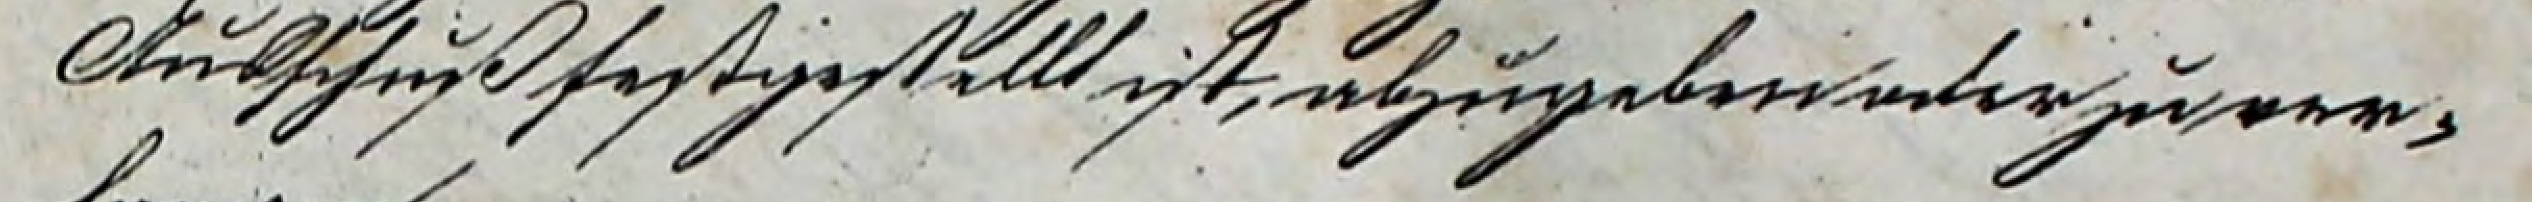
Ausschuß festgestellt ist, abzugeben oder zu ver„
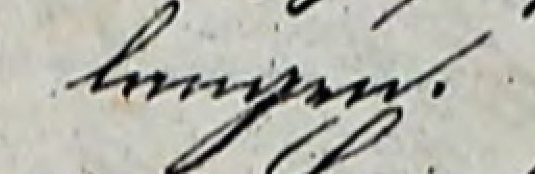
langen.
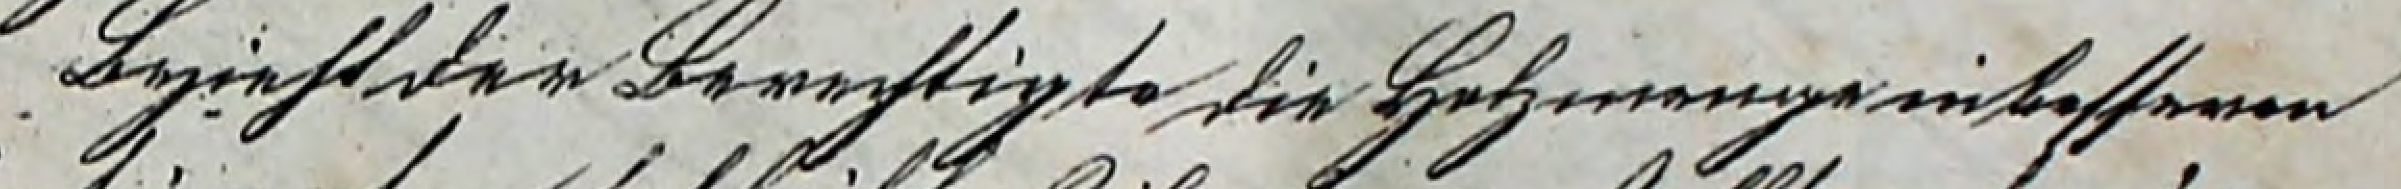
Bezieht der Berechtigte die Holzmenge in besseren
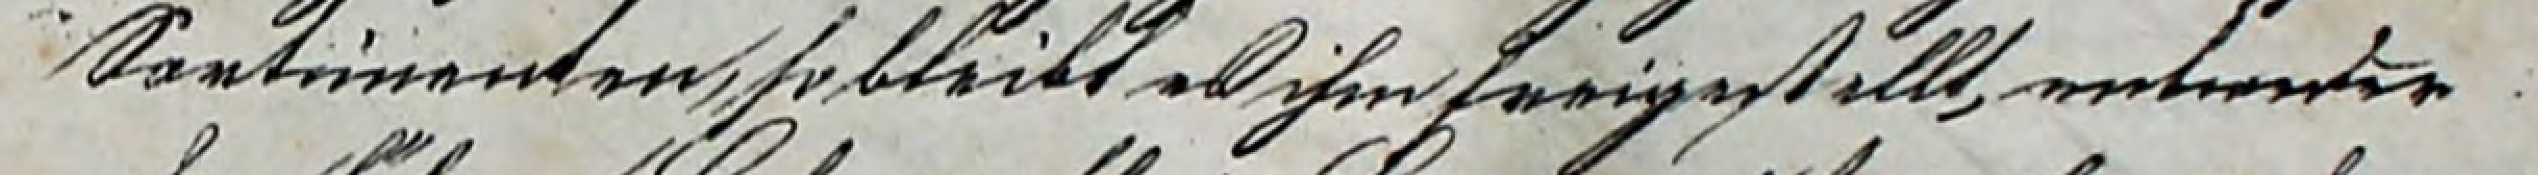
Sortimenten, so bleibt es ihm freigestellt, enteneder
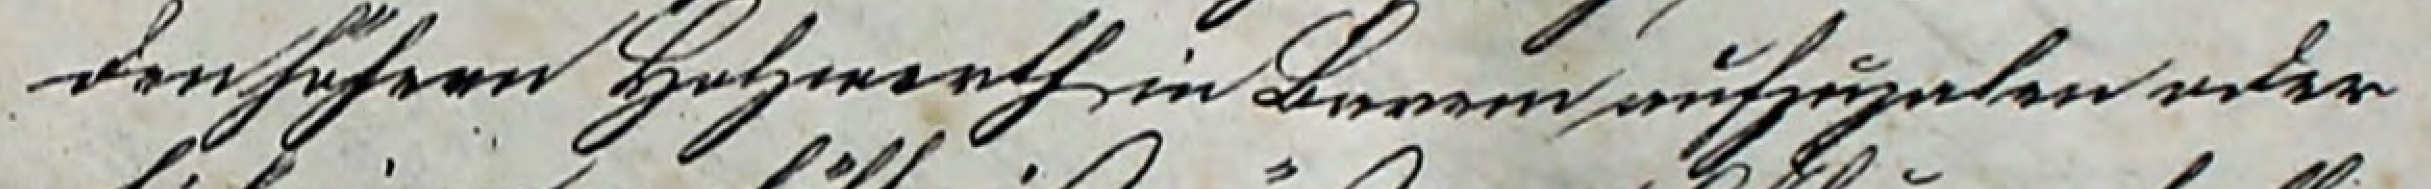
den höhern Holzwerth in Barem aufzugaten oder
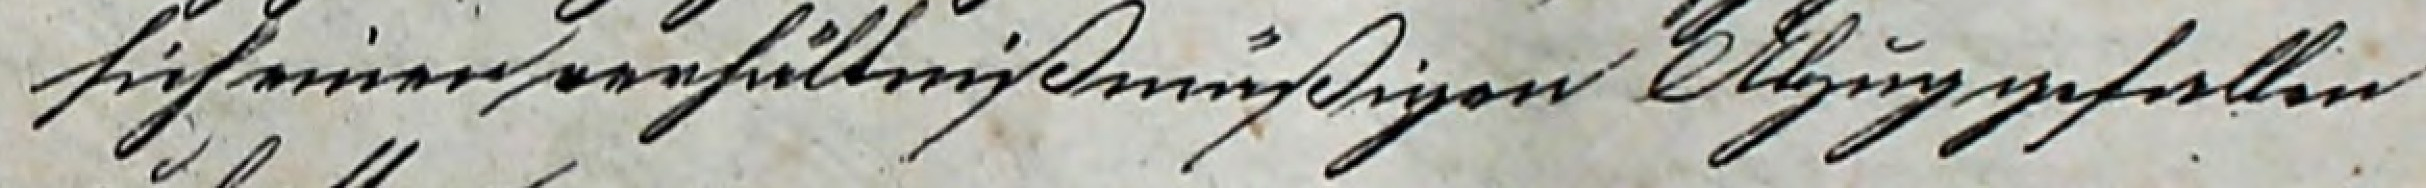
sicheinen verhältnißmäßigen Abzug gefallen
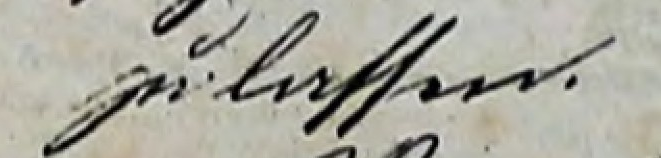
zu lassen.
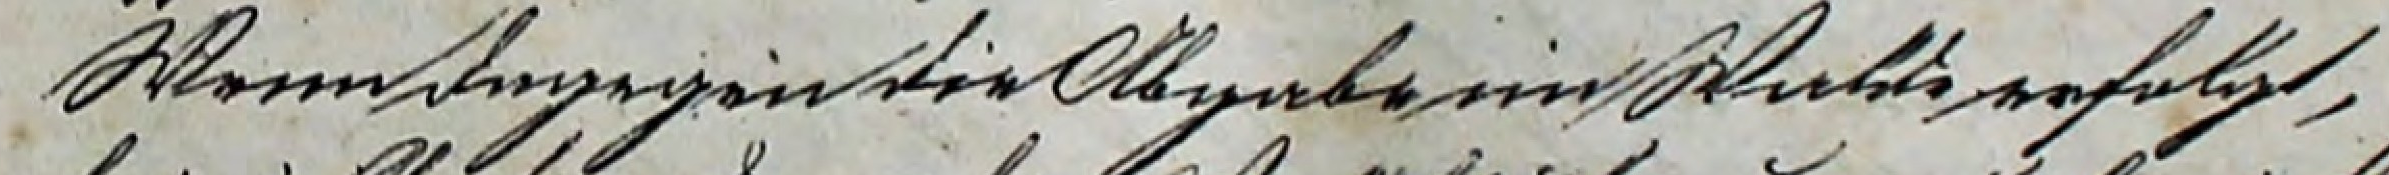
Wenn dagegen die Abgabe ein Walde erfolgt,
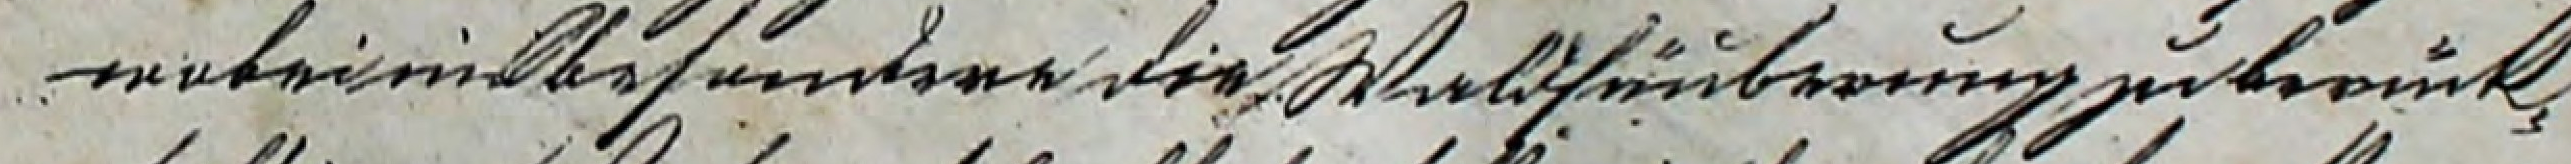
mobei in Blasandere die Waldsäuberung zu berück„
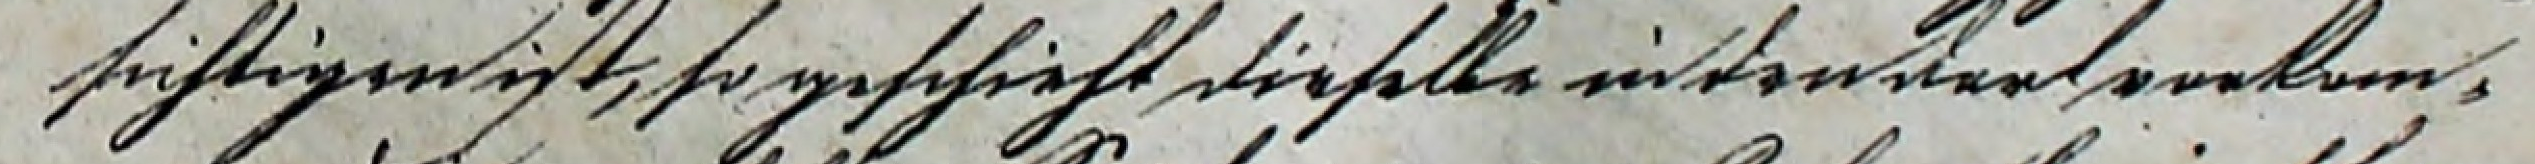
sichtigen ist, so geschirft dieselbe in den dert vorkom„
